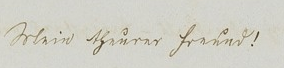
Mein theurer Freund!
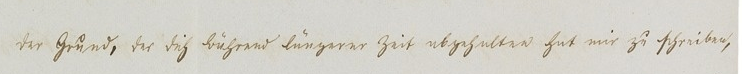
Der Grund, der dich während längerer Zeit abgehalten hat mir zu schreiben,
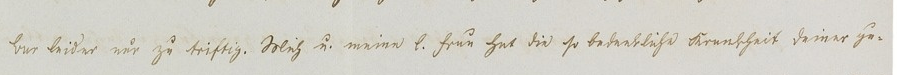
war leider nur zu triftig. Mich u. meine l. Frau hat die so bedenkliche Krankheit deiner gu-
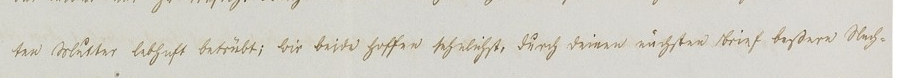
ten Mutter lebhaft betrübt; wir beide hoffen sehnlichst, durch deinen nächsten Brief beßere Nach-
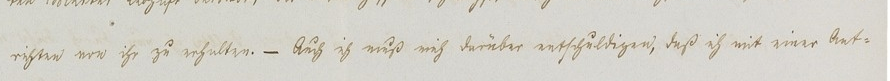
richten von ihr zu erhalten. – Auch ich muß mich darüber entschuldigen, daß ich mit einer Ant-
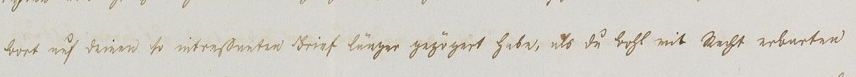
wort auf deinen so intreßanten Brief länger gezögert habe, als du wohl mit Recht erwarten
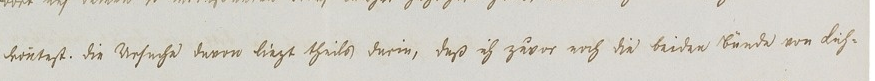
konntest. Die Ursache davon liegt theils darin, daß ich zuvor noch die beiden Bände von Lich-
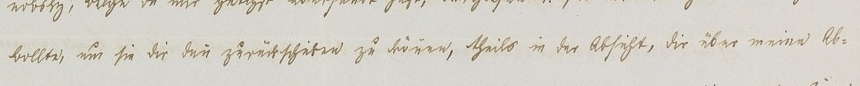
wollte, um sie dir dann zurückschicken zu können, theils in der Absicht, dir über meine Ab-
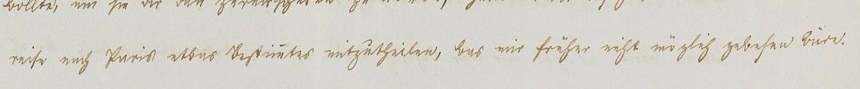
reise nach Paris etwas bestimmtes mitzutheilen, was mir früher nicht möglich gewesen wäre.
